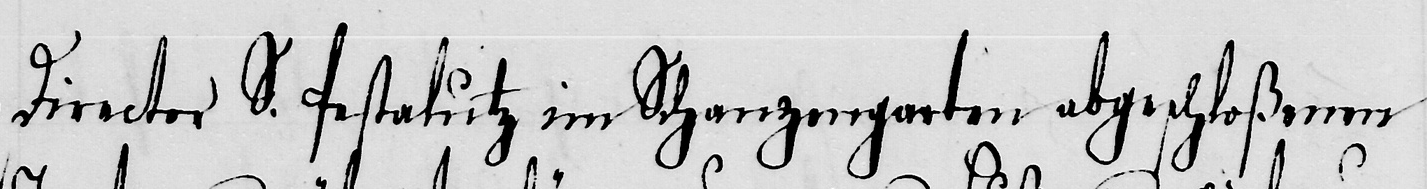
Director S. Pestalutz im Schanzengarten abgeschloßenen
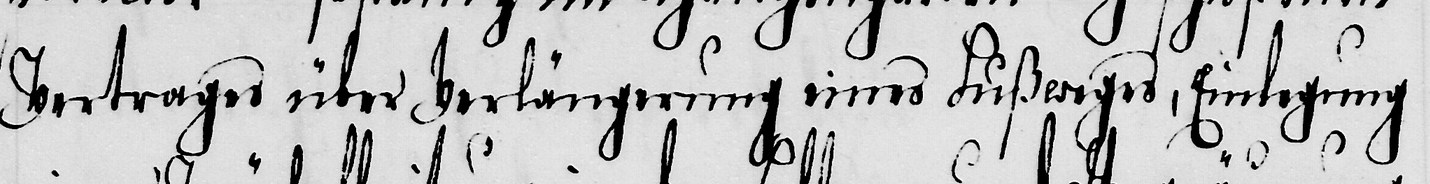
Vertrages über Verlängerung eines Fußweges, Einlegung
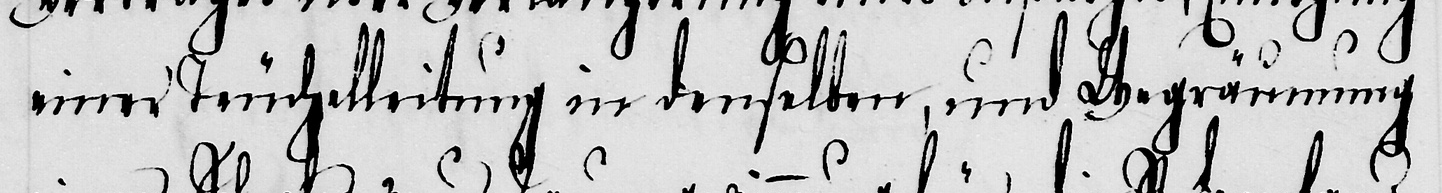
einer Teuchelleitung in denselben, und Wegräumung
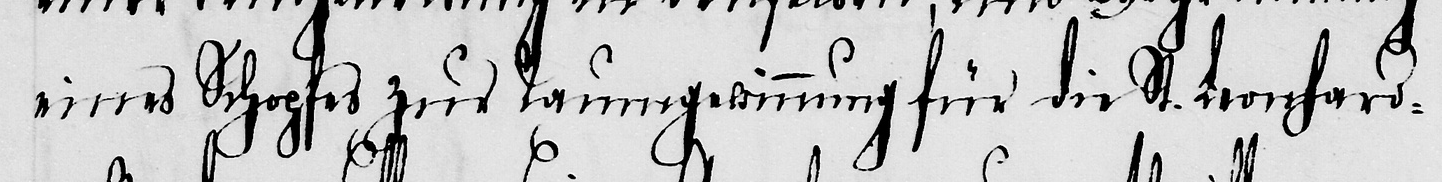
eines Schopfes zur Raumgewinnung für die St. Leonhard¬
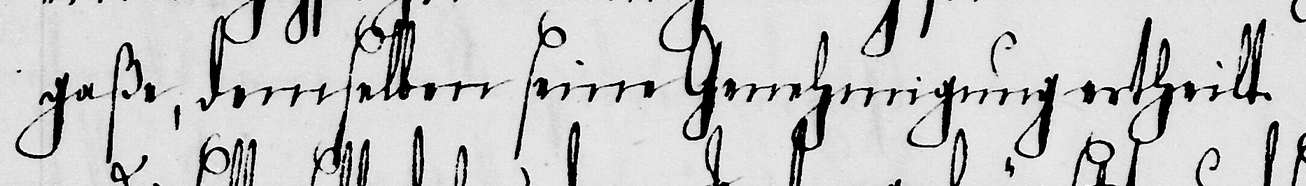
gaße, demselben seine Genehmigung ertheilt.
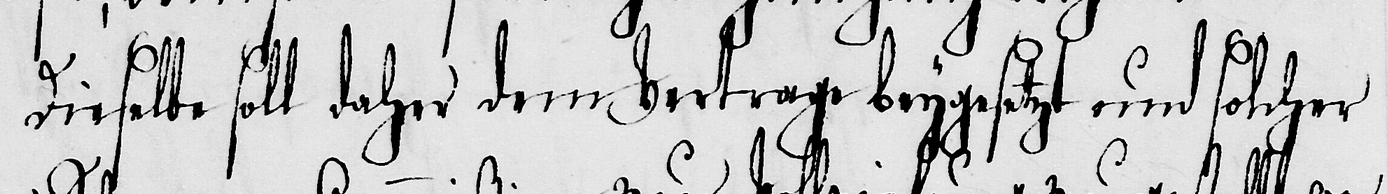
ieselbe soll daher dem Vertrage beygesetzt und solcher
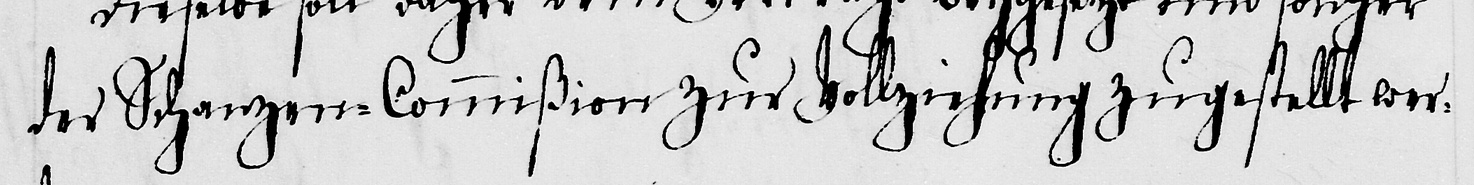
der Schanzen-Commißion zur Vollziehung zugestellt wer¬
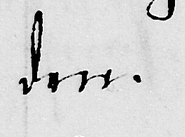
den.
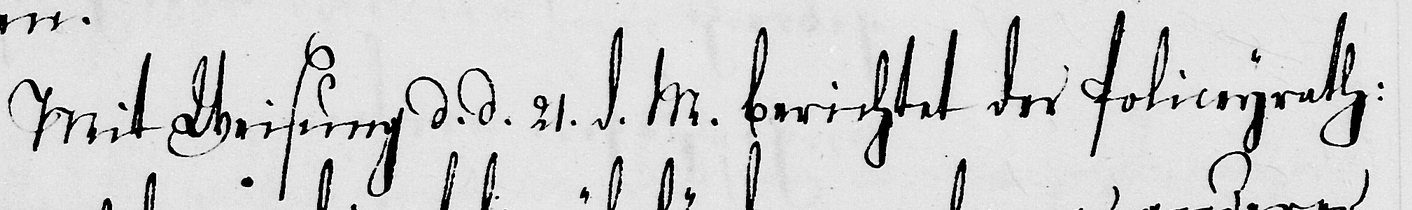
Mit Weisung d. d. 21. d. M. berichtet der Policeyrath:
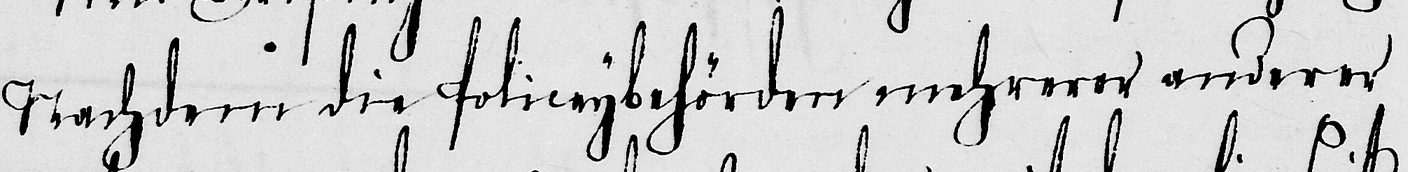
Nachdem die Policeybehörden mehrerer anderer
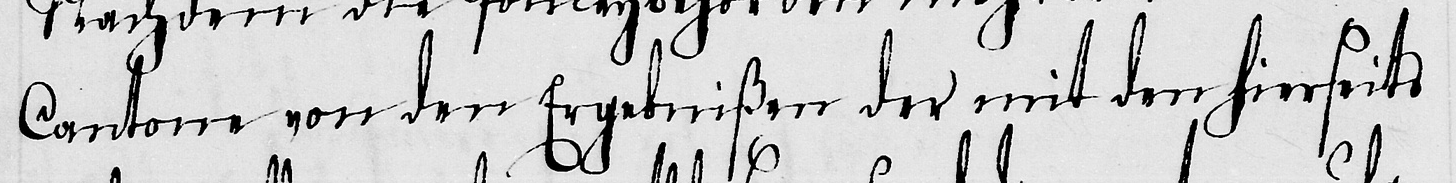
Cantone von den Ergebnißen der mit den hierseits
